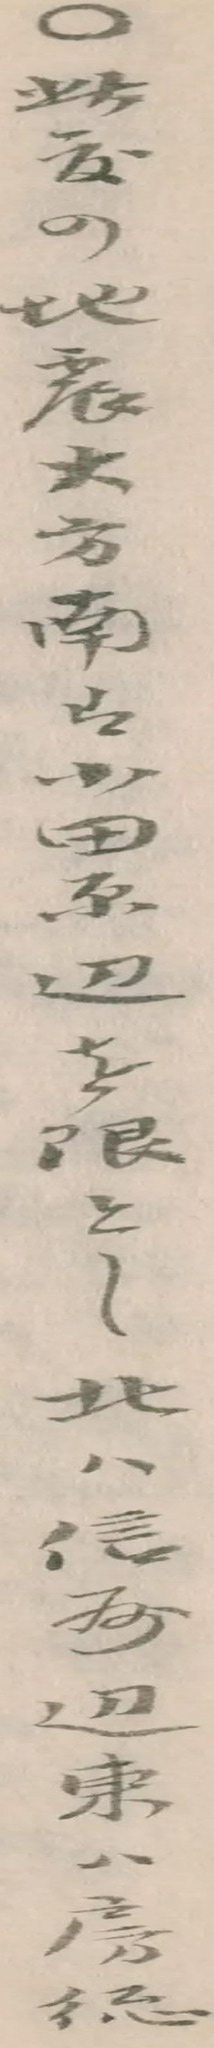〇此度の地震大方南は小田原辺を限とし北は信州辺東は房総
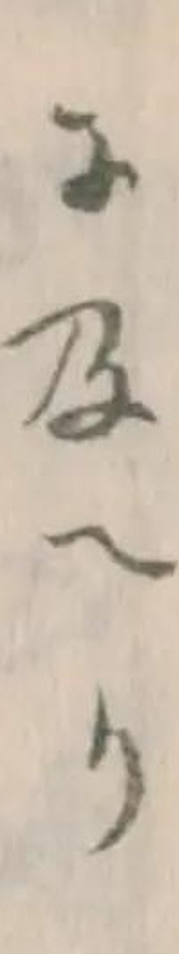に及へり
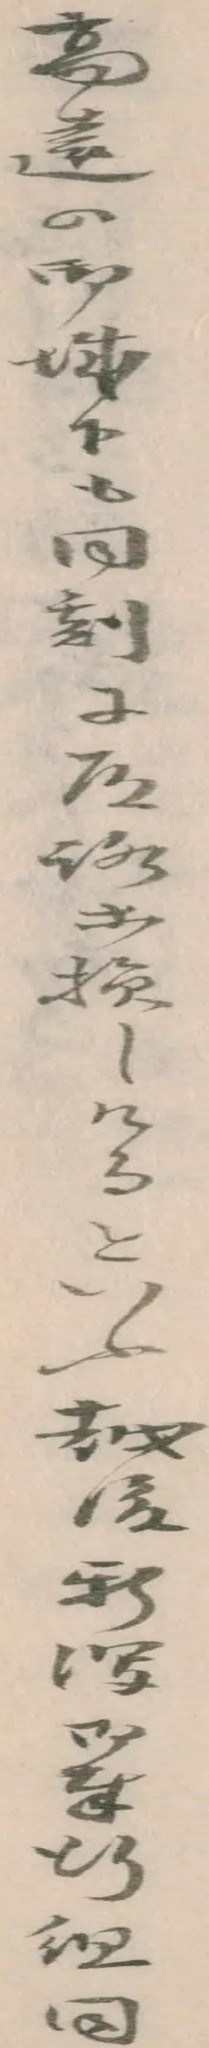高遠の御城下も同刻に道路等損しけるといふ越後新潟御奉行組同
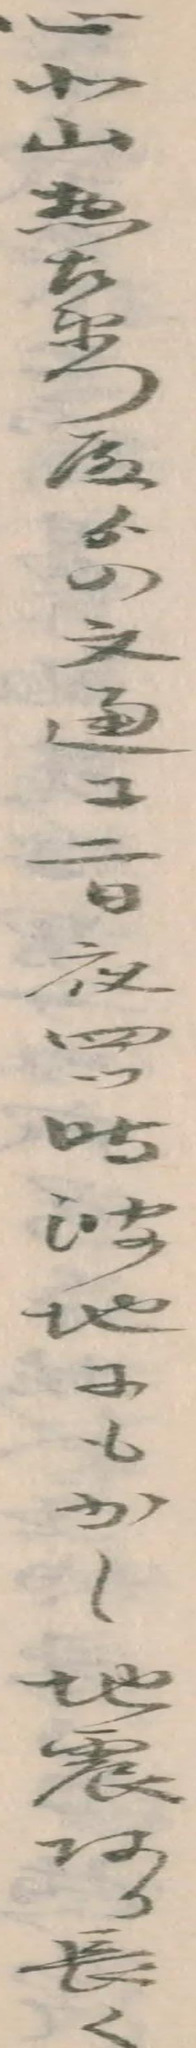心北山惣右衛門殿ゟの文通に二日夜四ツ時彼地にも少し地震あり長く
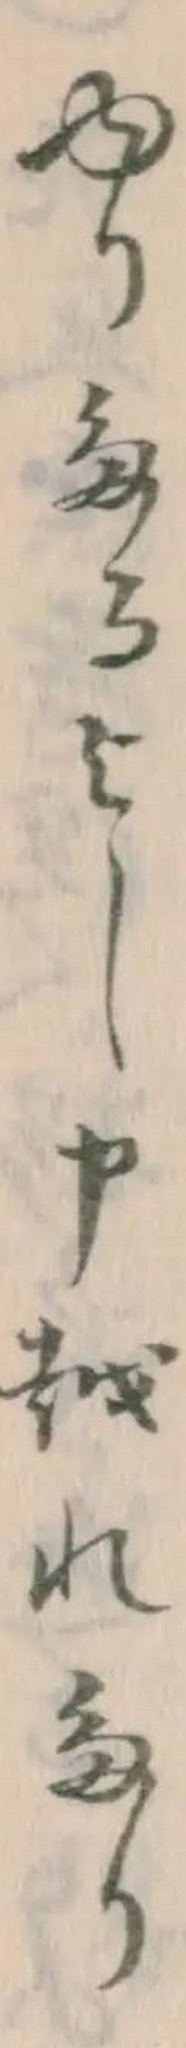ゆりたるよし申越れたり
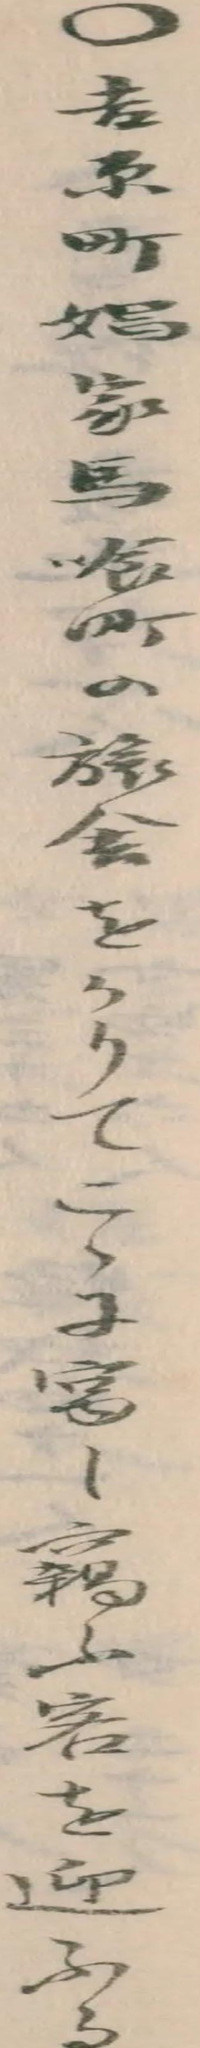〇吉原町娼家馬喰町の旅舎をかりてこゝに寓し窃ふ客を迎ふる
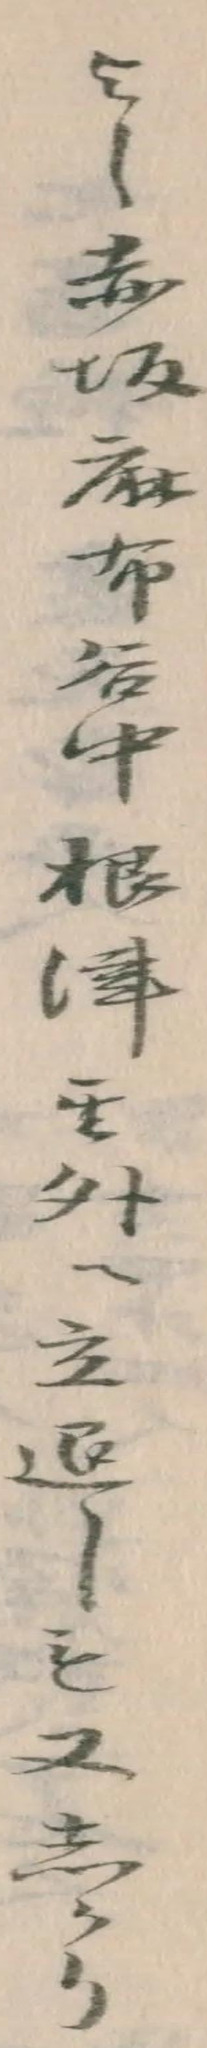よし赤坂麻布谷中根津其外へ立退しも又しかり
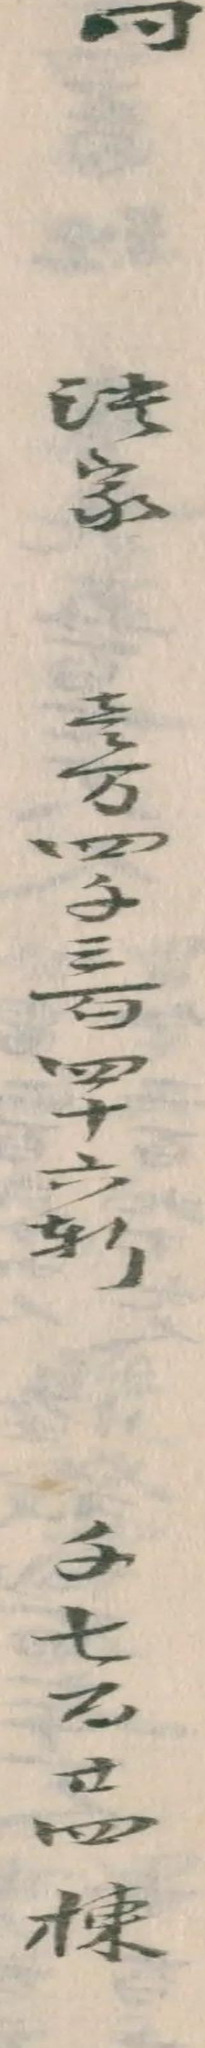同潰家壱万四千三百四十六軒千七百廿四棟
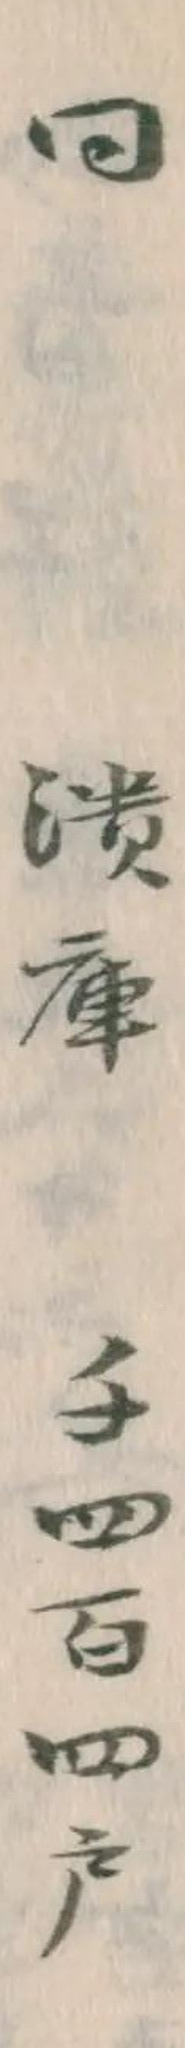同潰庫千四百四戸
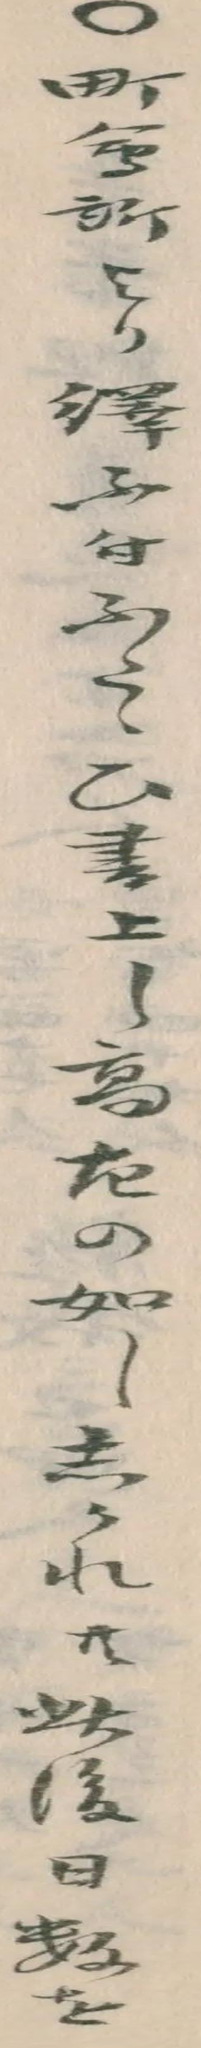〇町会所より繹ふ付ふたゝひ書上し高左の如ししかれ共此後日数を
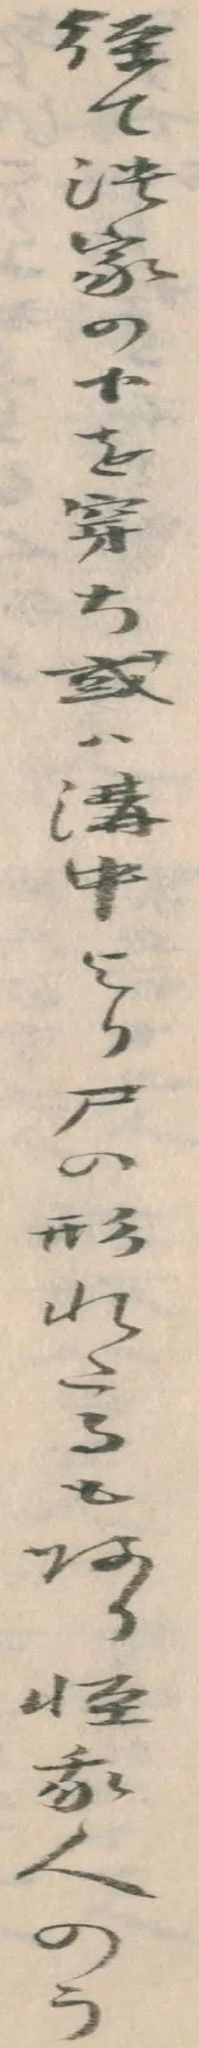経て潰家の下を穿ち或は溝中より屍の形れたるもあり怪我人のう
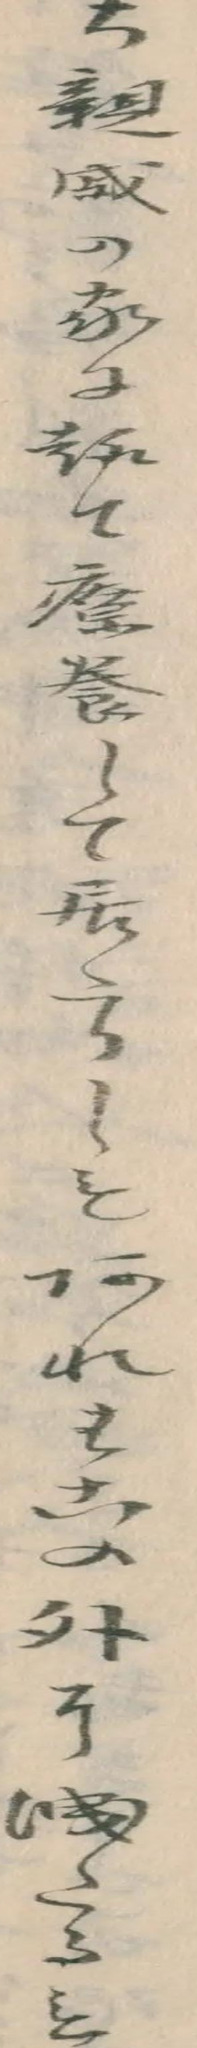ち親戚の家に趣て療養して居たりしもあれはこの外に洩たるも

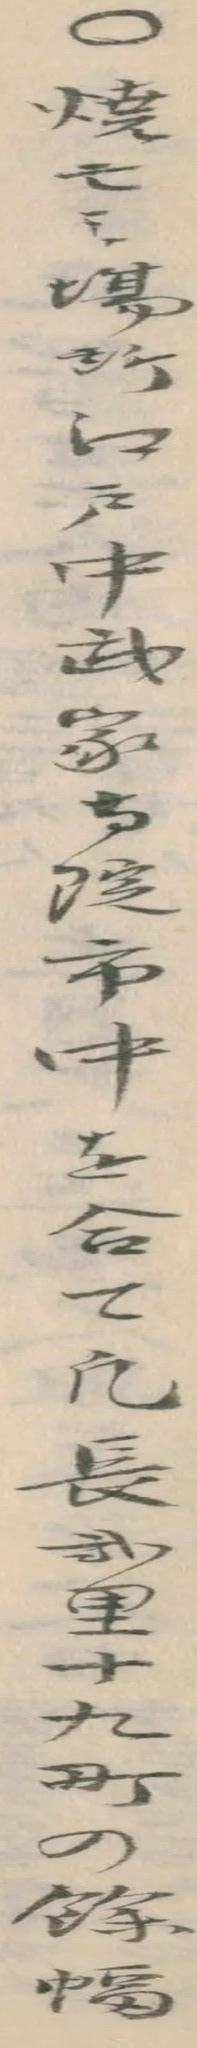〇焼亡之場所江戸中武家寺院市中を合て凡長弐里十九町の余幅
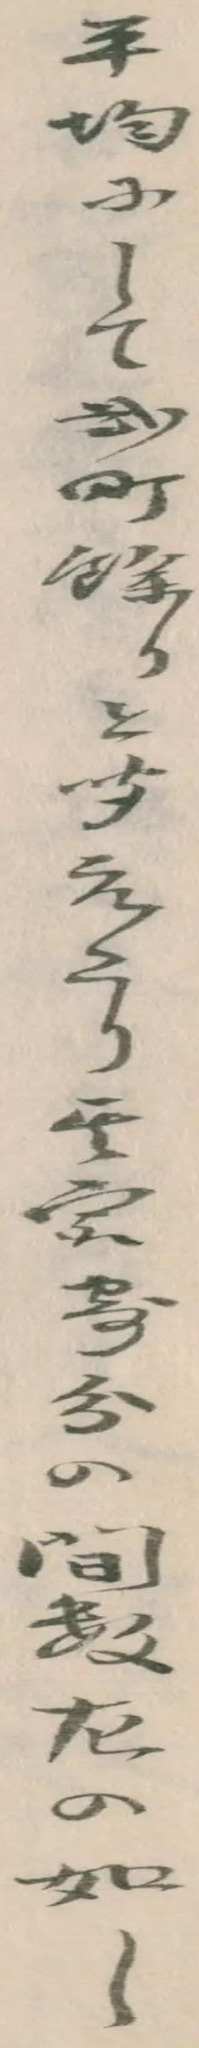平均にして弐町余りと聞えたり其最寄分の間数左の如し
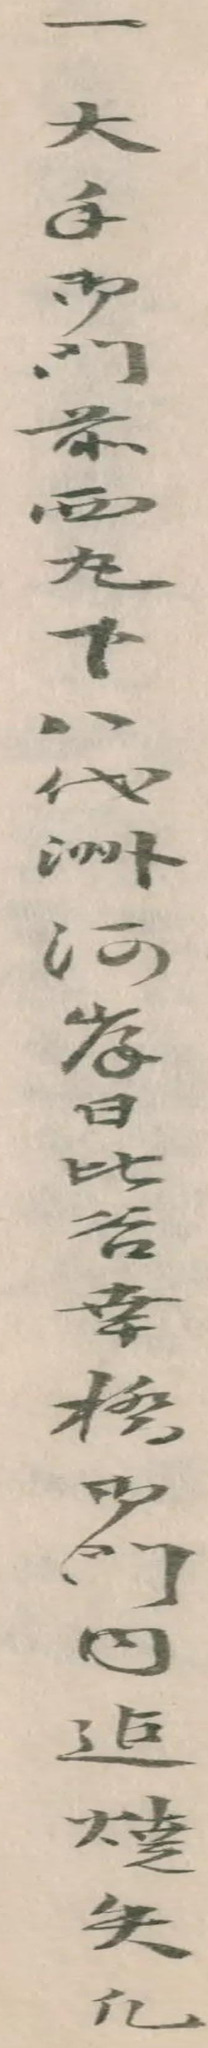一大手御門前西丸下八代洲河岸日比谷幸橋御門内迄焼失凡
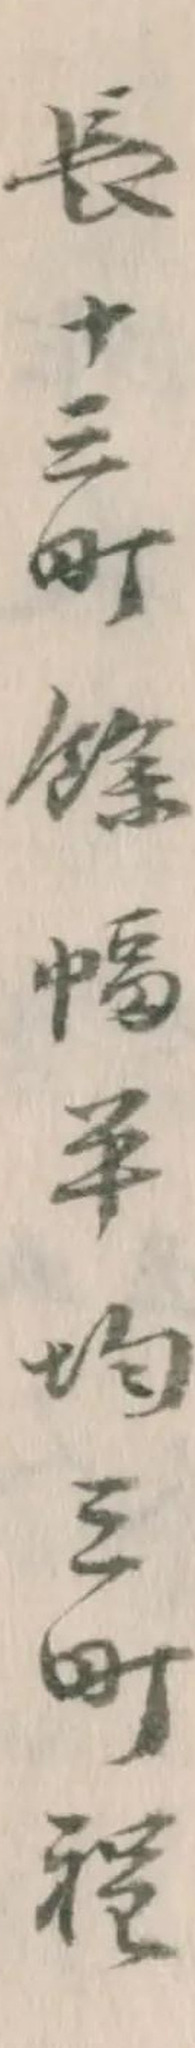長十三町余幅平均三町程
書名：地災撮要. 巻7-9(地震之部)
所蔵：国立国会図書館 National Diet Library, JAPAN
